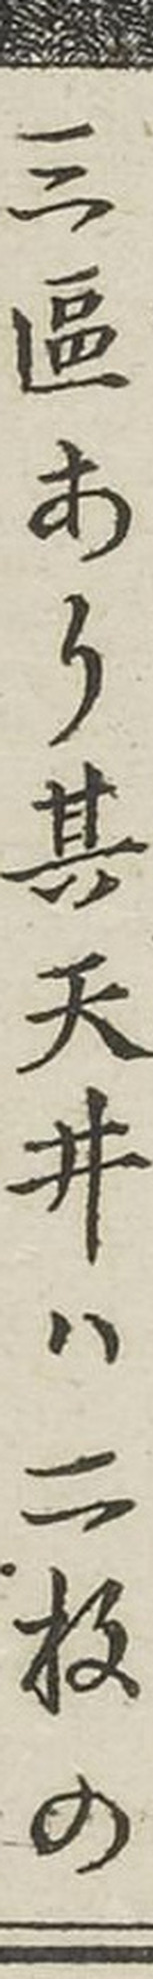三区あり其天井は二枚の

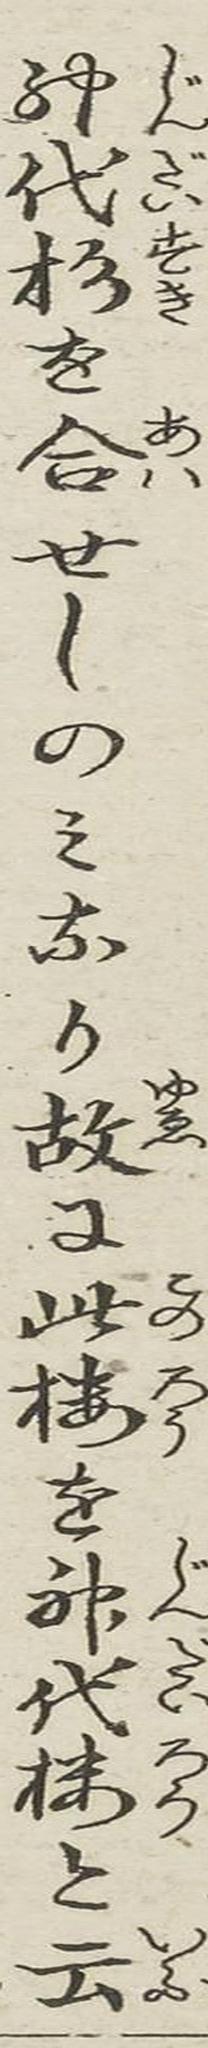神代杉を合せしのみなり故に此楼を神代楼と云
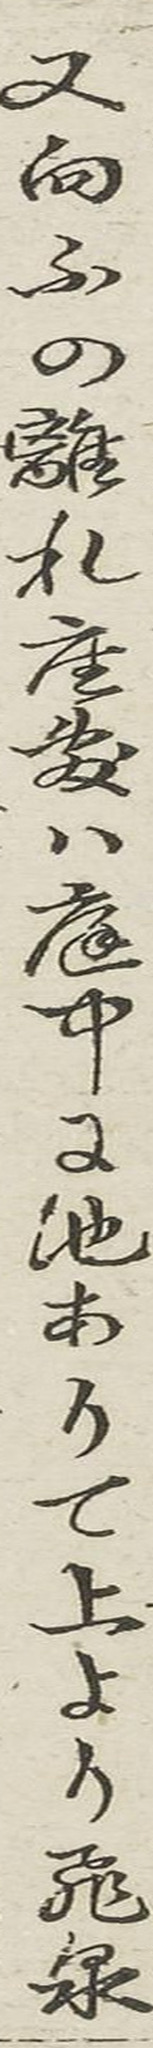又向ふの離れ座敷は庭中に池ありて上より飛泉
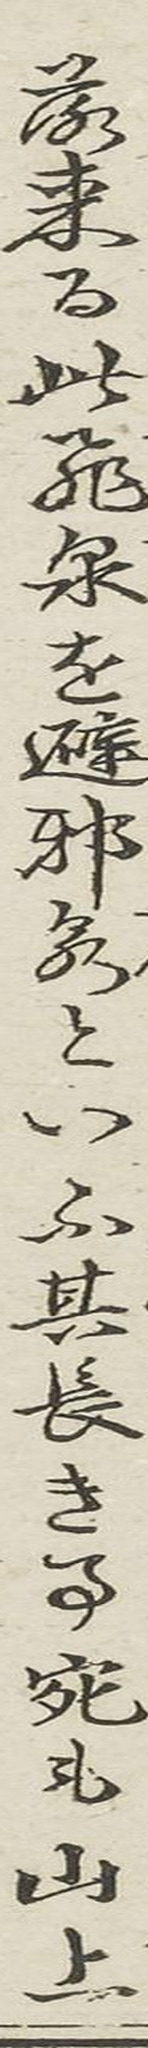落来る此飛泉を避邪泉といふ其長き事宛も山上
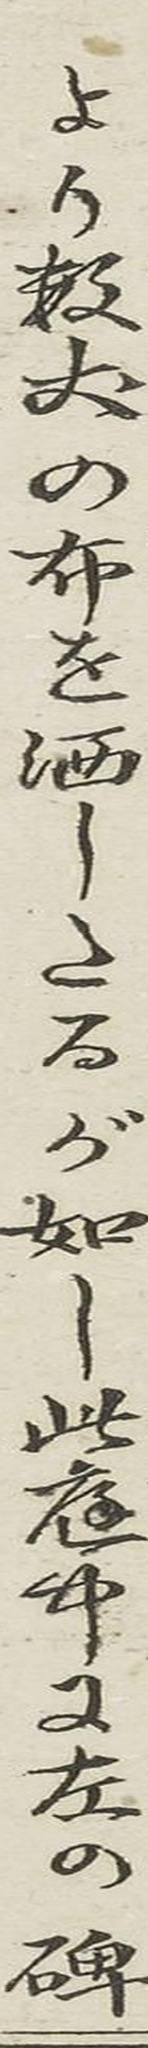より数丈の布を晒したるが如し此庭中に左の碑
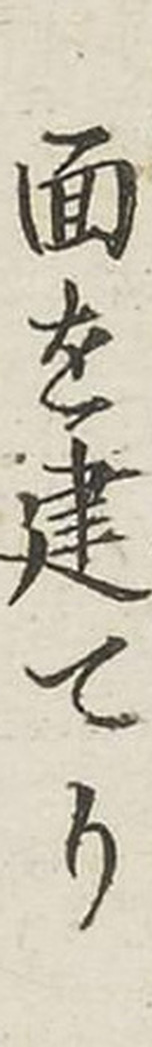面を建てり
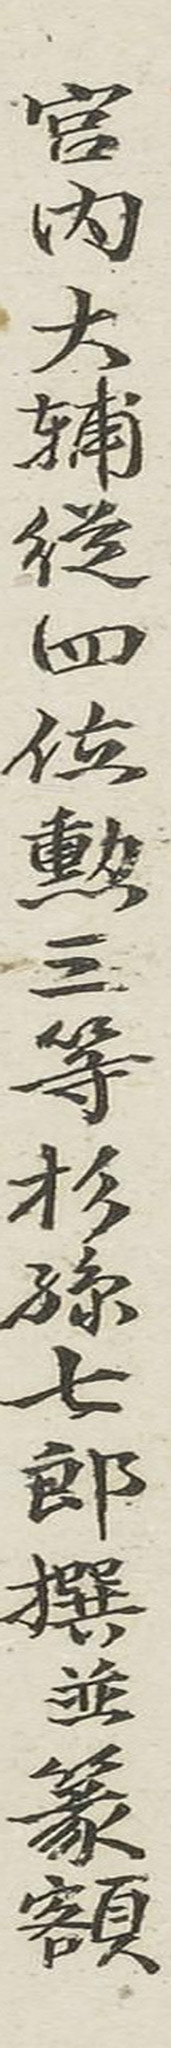宮内大輔従四位勲三等杉孫七郎撰並篆額
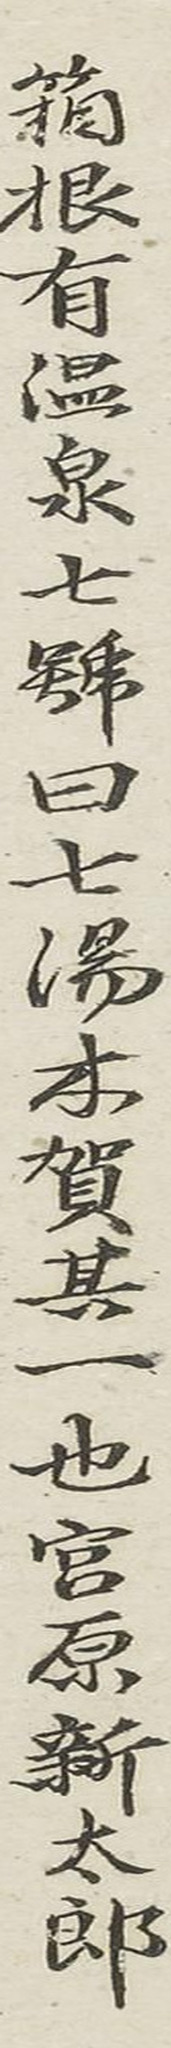箱根有温泉七號曰七湯木賀其一也宮原新太郎
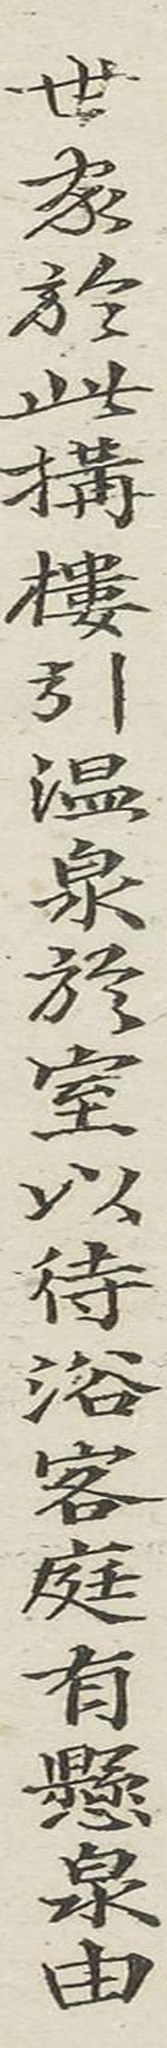世家於此構樓引温泉於室以待浴客庭有懸泉由
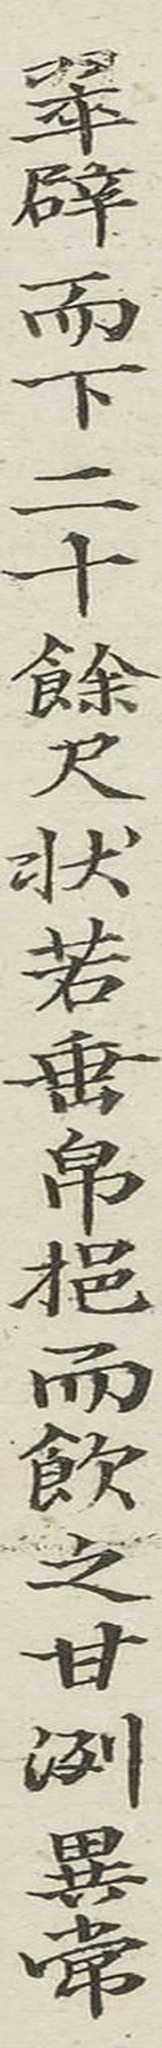翠辟而下二十餘尺状若垂帛挹而飲之甘洌異常
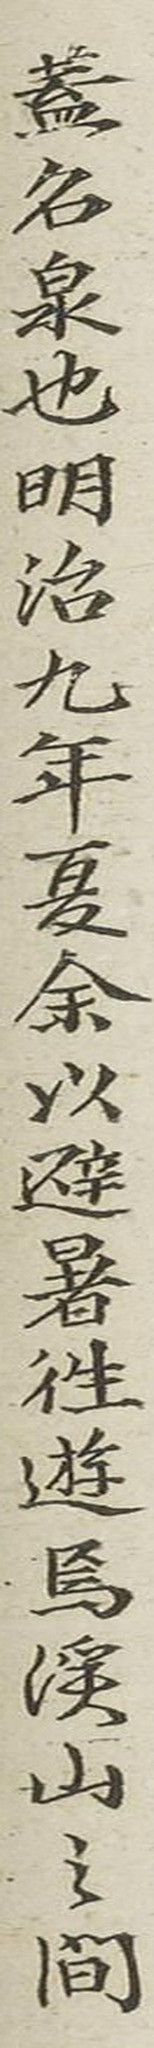蓋名泉也明治九年夏余以避暑往遊為溪山之間
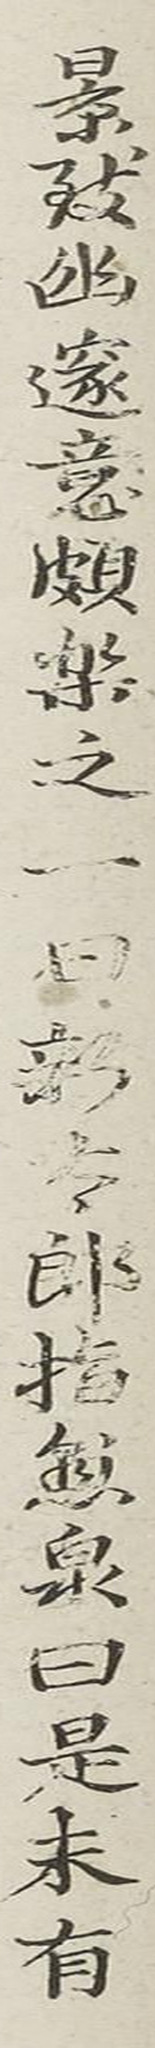景致幽邃意頗楽之一日新太郎指懸泉曰是未有
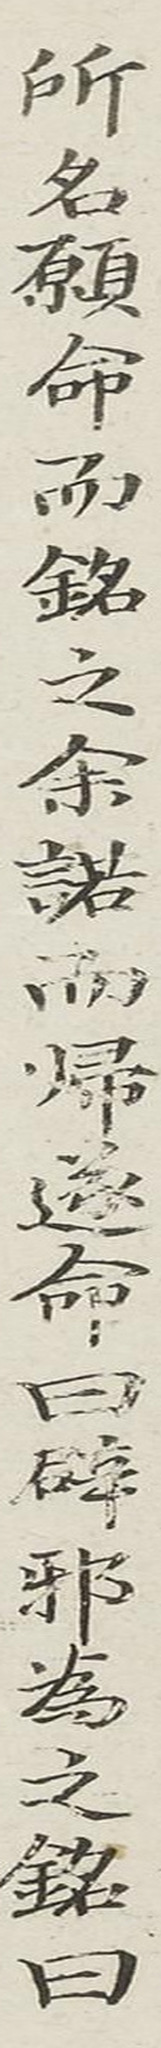所名願命而銘之余諾而帰遂命曰辟邪為之銘曰
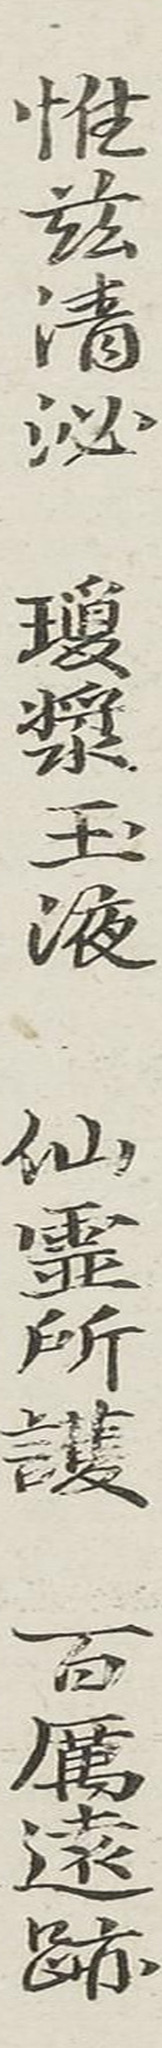惟茲清泌瓊漿玉液仙霊所護百萬遠跡
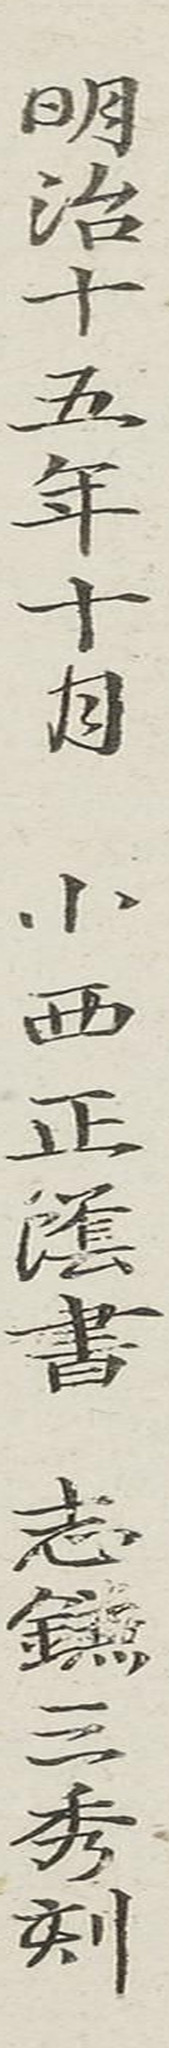明治十五年十月小西正陰書志鎌三秀刻
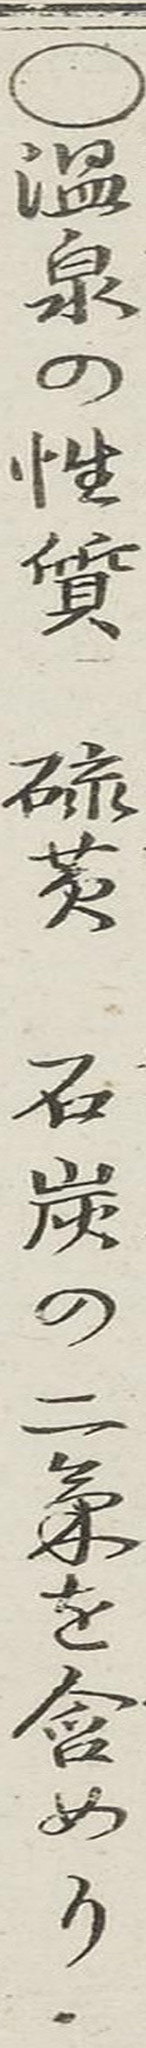○温泉の性質硫黄石炭の二氣を含めり
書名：箱根温泉誌　全
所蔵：東京大学地震研究所図書室 Earthquake Research Institute Library, The University of Tokyo, JAPAN
